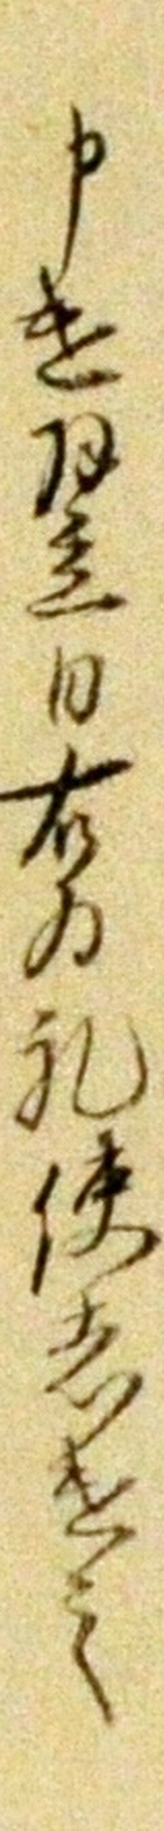申遣翌日右為礼使者遣之
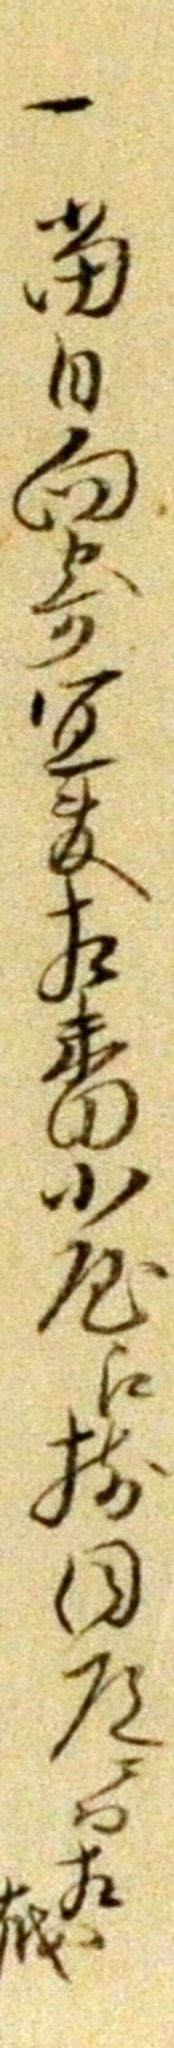一当日向寄宜敷相番小屋江揃同道ニ而相越
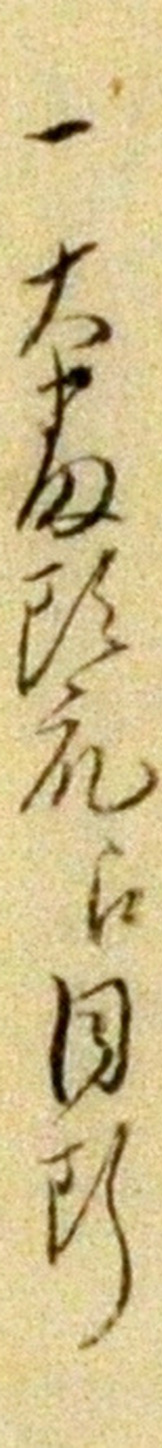一大番頭衆江同断
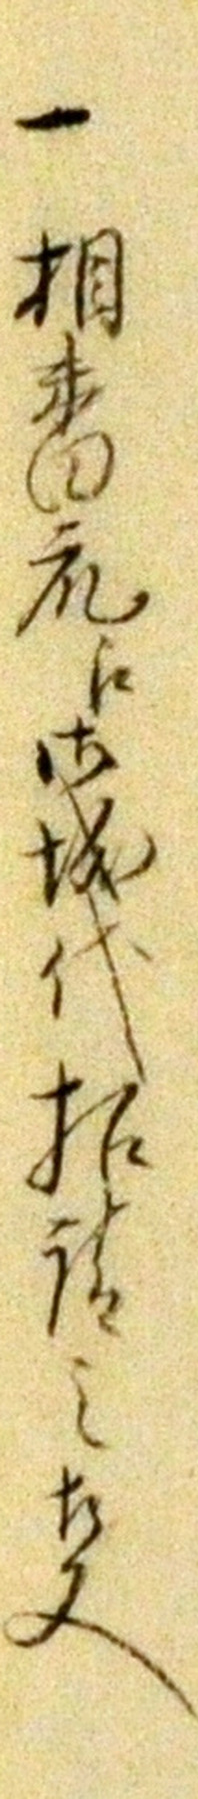一相番衆江御城代招請之事
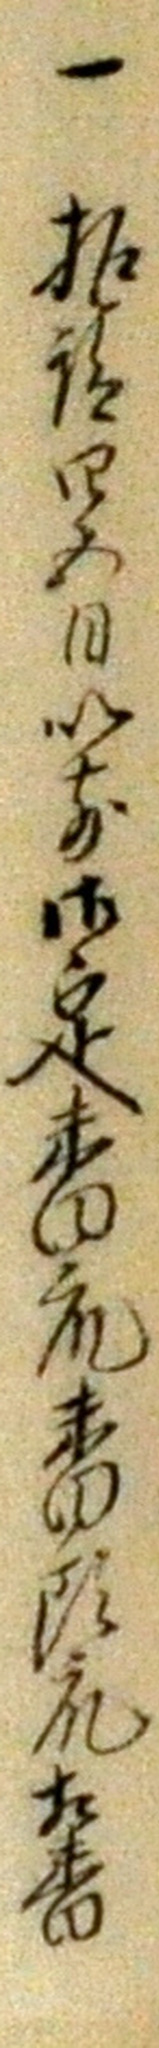一招請四五日以前御定番衆番頭衆相番
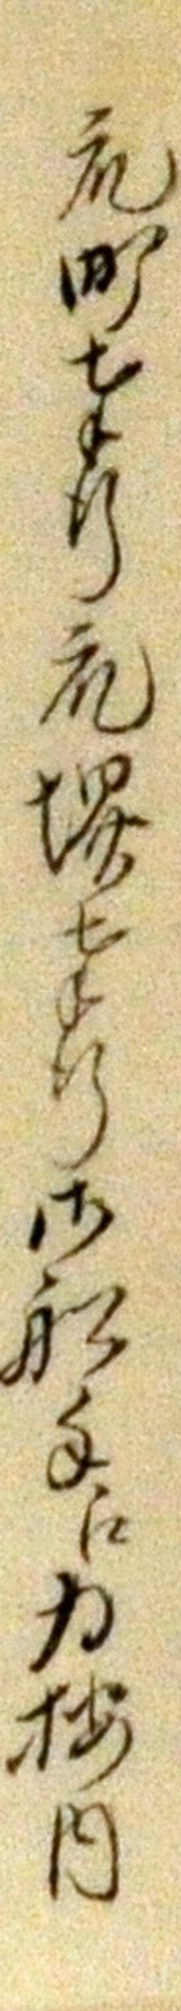衆町奉行衆衆堺奉行御船手江為案内
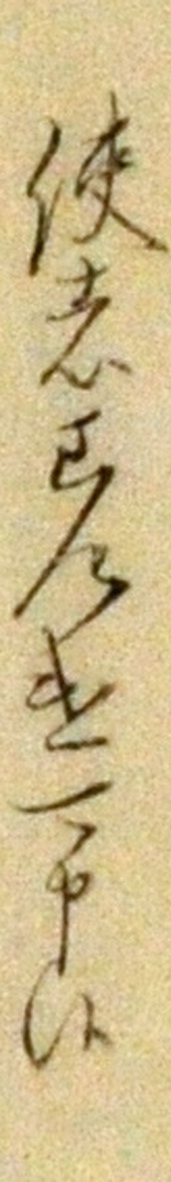使者差遣可申候
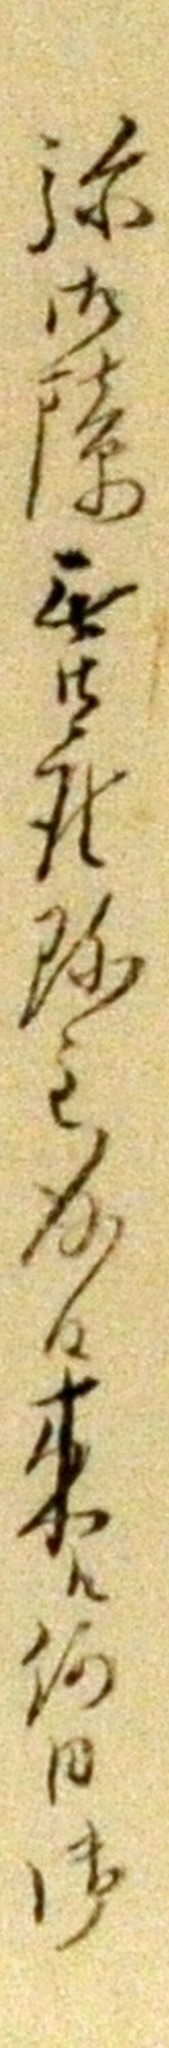弥御障無御座珍重存候来ㇽ何日御
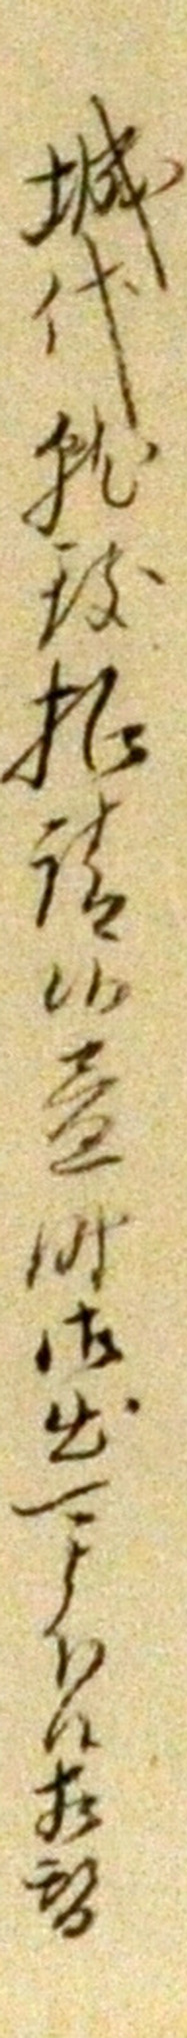城代就致招請御昼時御出可被下候相替
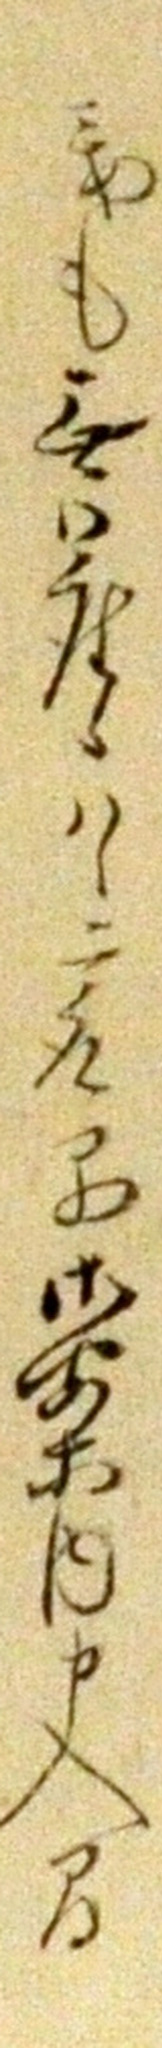義も無御座候ハヽ最早御案内申入間
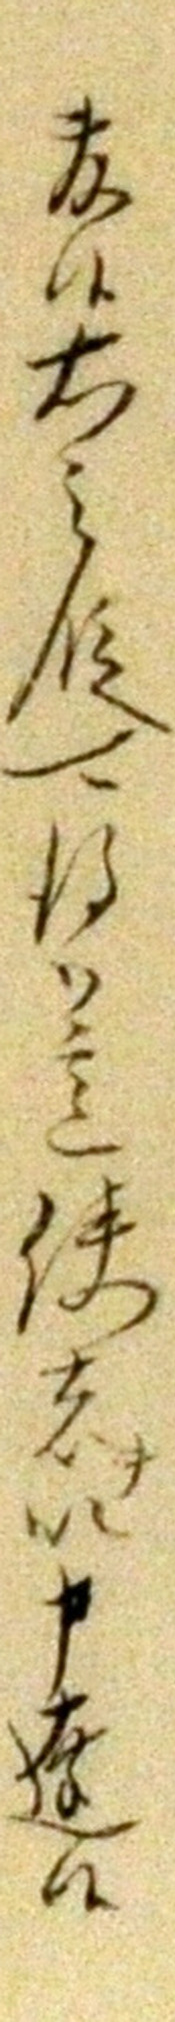敷候右之段可得御意使者ヲ以申達候
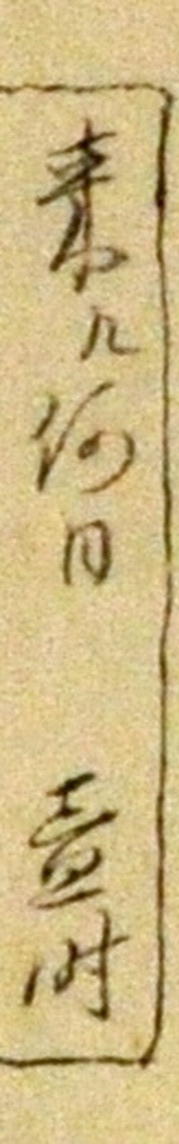来ㇽ何日昼時
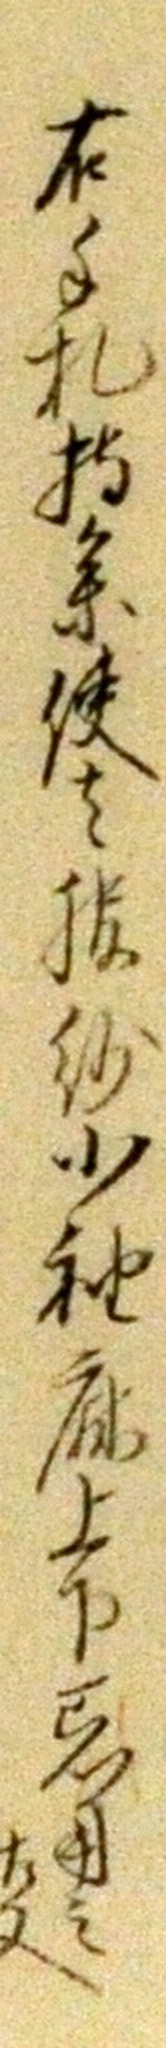右手札持参使者服紗小袖麻上下着用之事
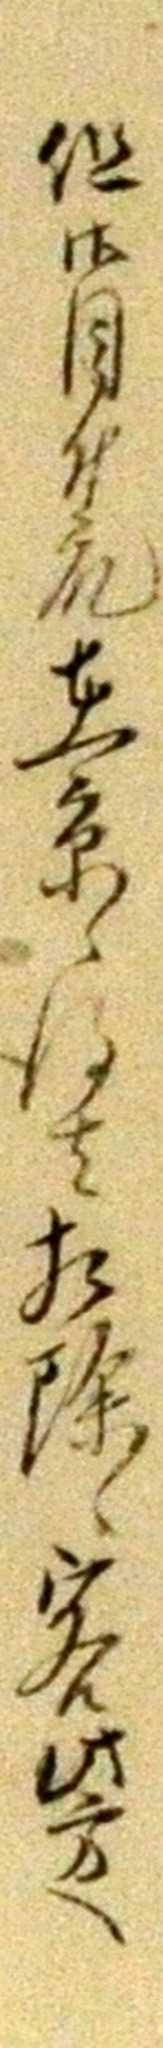但御目付衆在京候得者相除候客此方へ
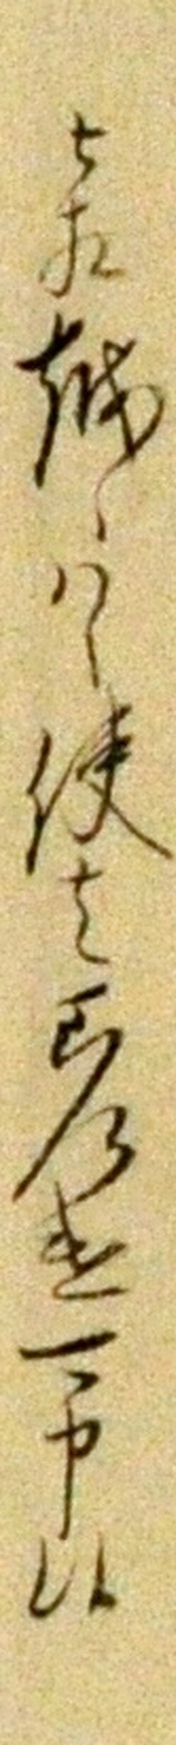被相越候ハヽ使者差遣可申候
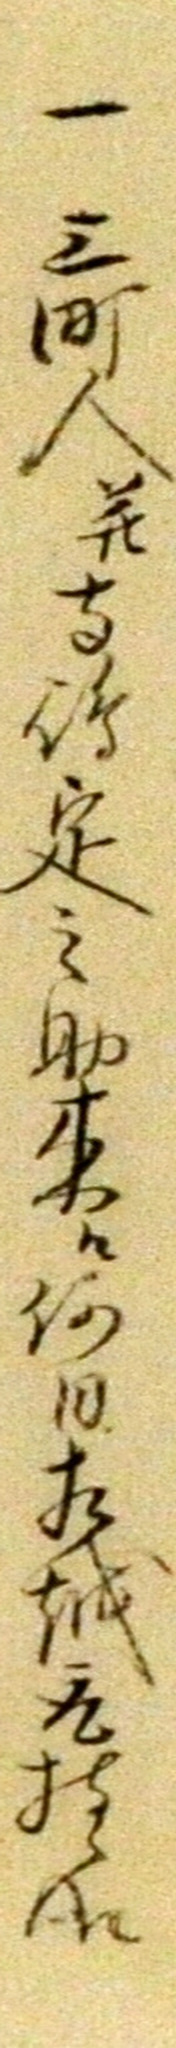一三町人并寺嶋定之助来ㇽ何日相越取持候様
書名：大阪加番関係諸書留〔一括〕
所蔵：伊那市立高遠町図書館・合同会社AMANE
